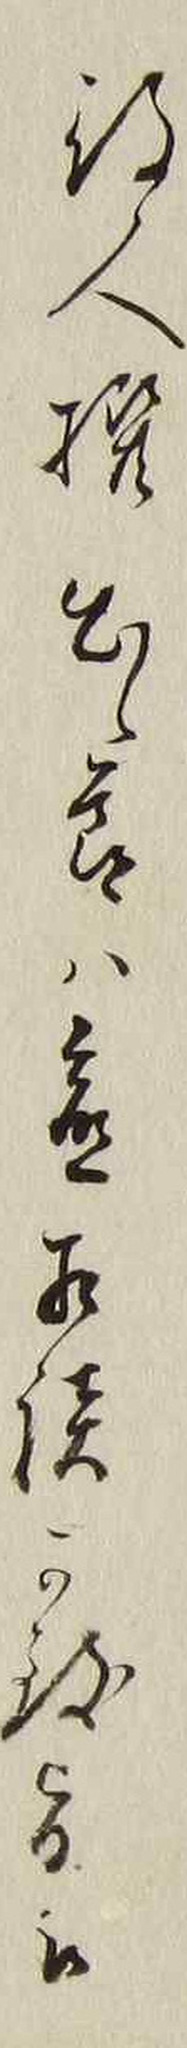役人選出候節は置相談可致旨被
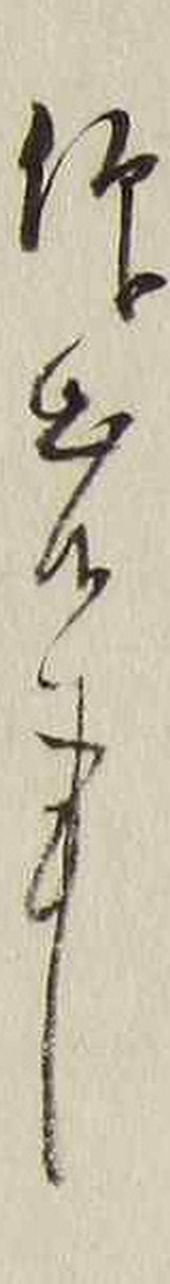仰出候事

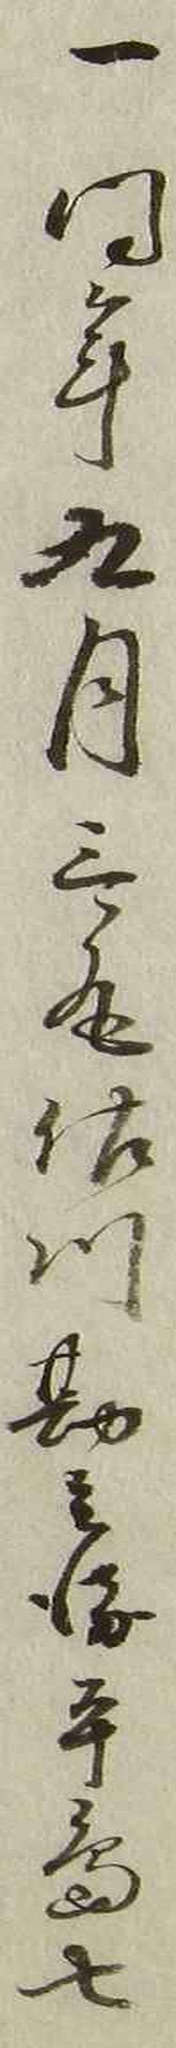一同年九月三之丸佐川勘兵衛平鳥七
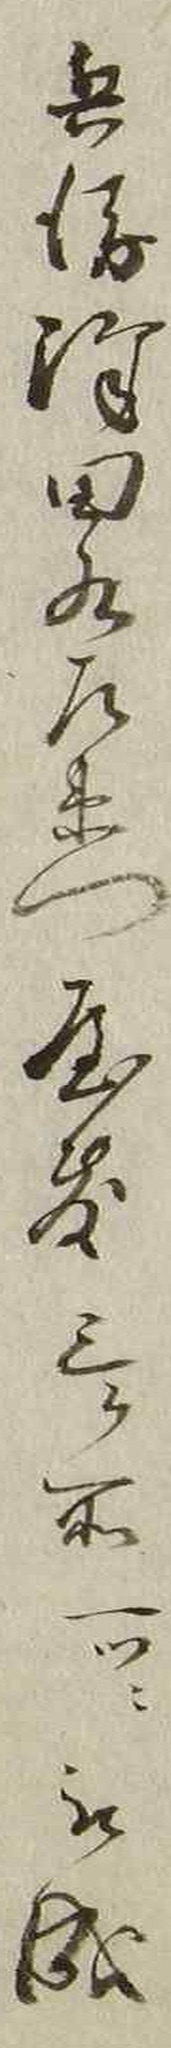兵衛譯田水左衛門三ヶ所一つに被成
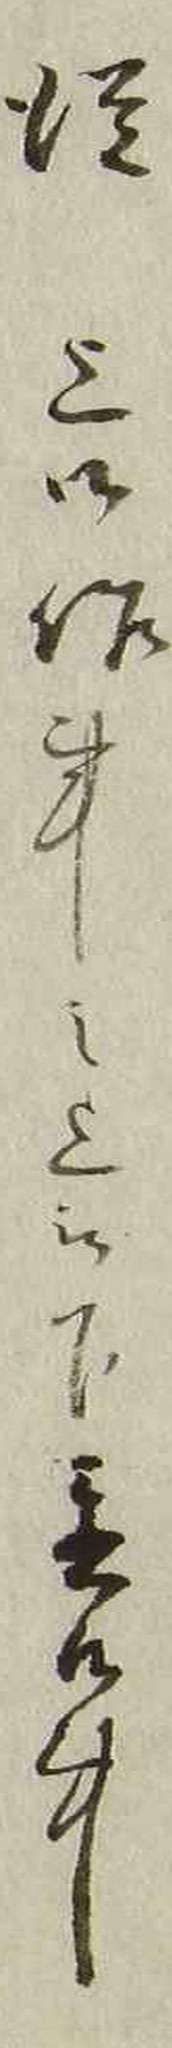従迄御作事之上被下置候事
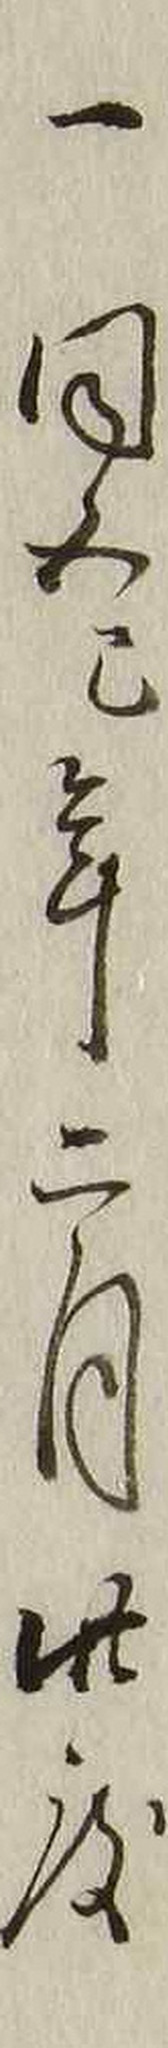一同五巳年二月此度
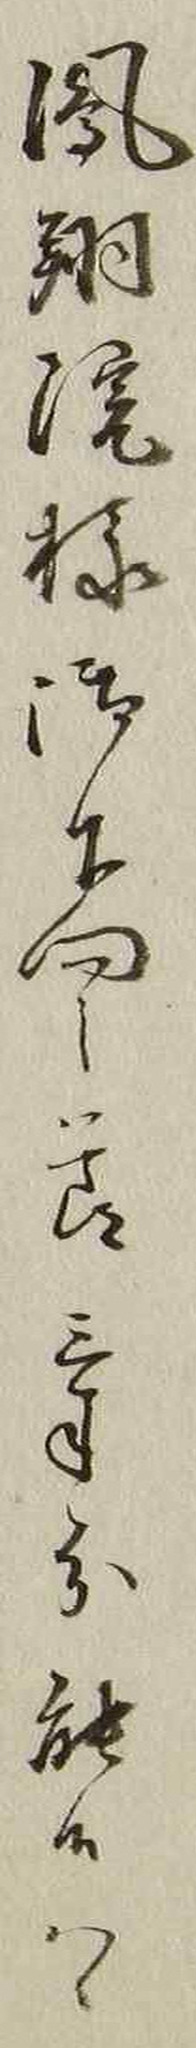鳳翔院様御下向之節気分能候ハゝ
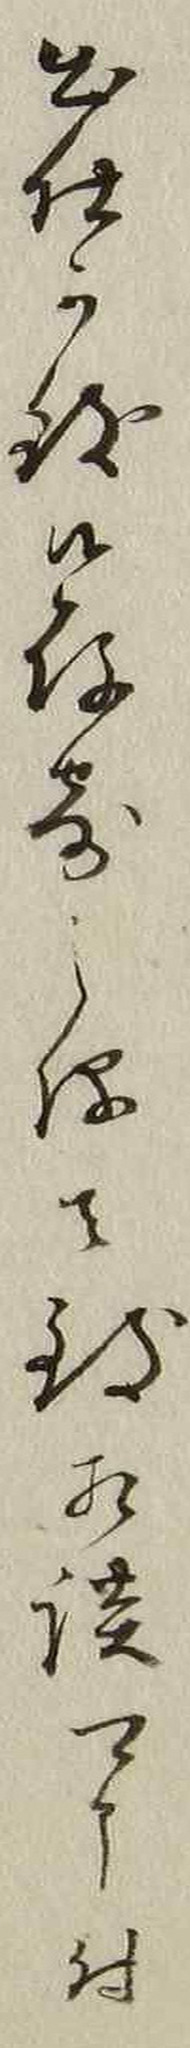出仕可致候存寄之儀は致相談可申付
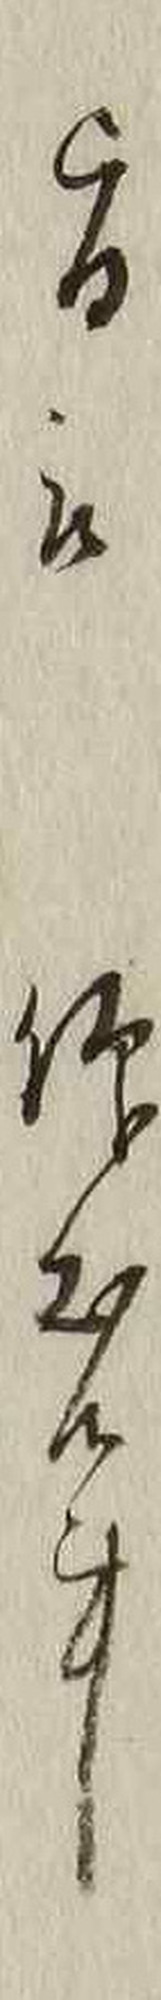旨被仰出候事
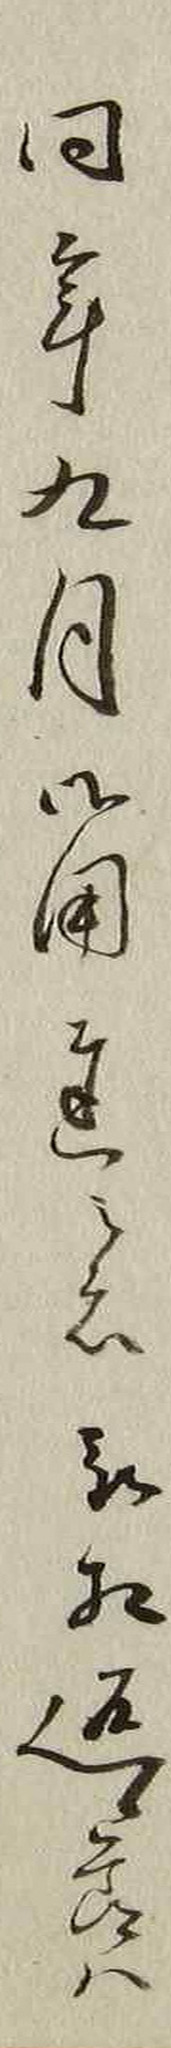一同年九月御用達之者被相返候節は
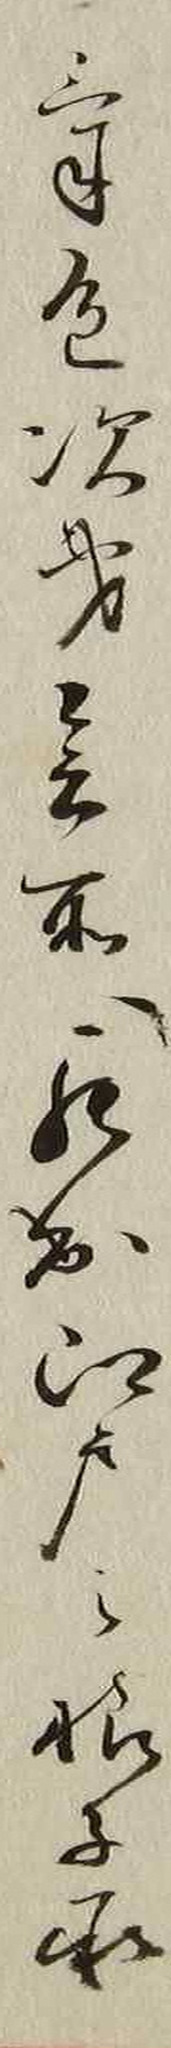気色次第会所へ罷出江戸之様子承
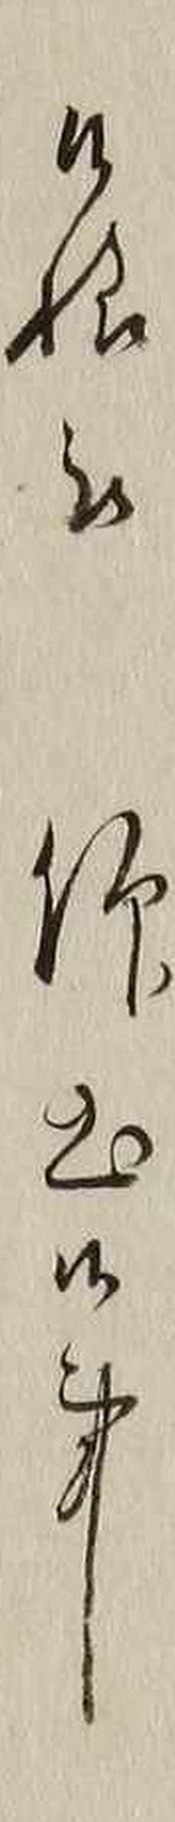侯様被仰出候事
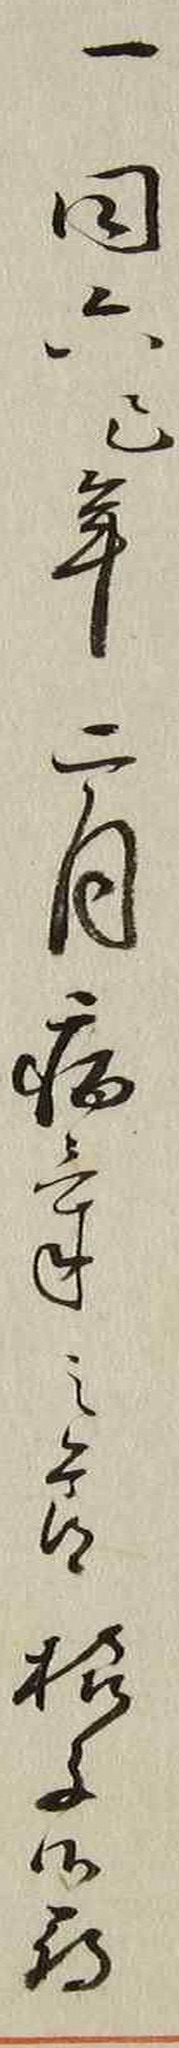一同六己年二月病気之節様子御尋
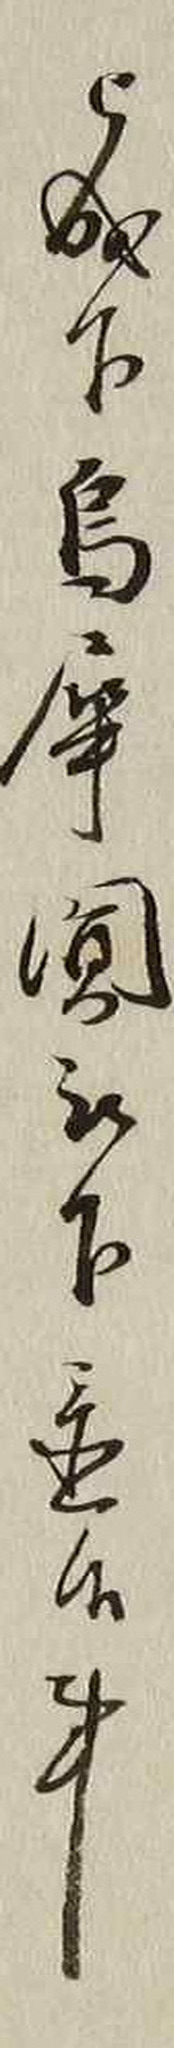被成下烏犀円被下置候事
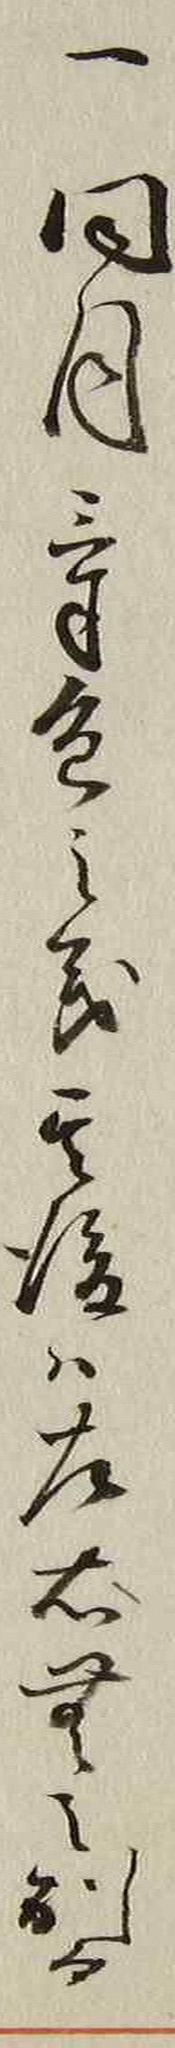一同月気色之義其後ハ左右無之別而
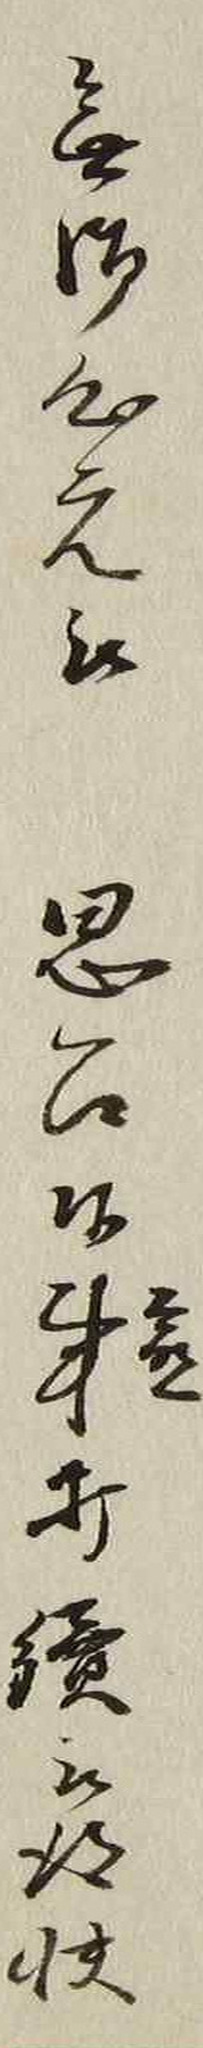無御心元被思召候事打続被得快
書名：諸士系譜　巻之159　な之部1
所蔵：会津若松市立会津図書館
